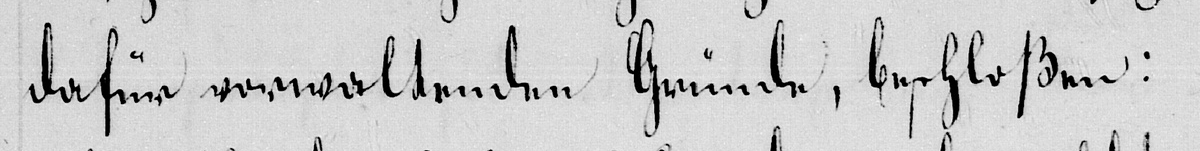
dafür vorwaltenden Gründe, beschloßen:
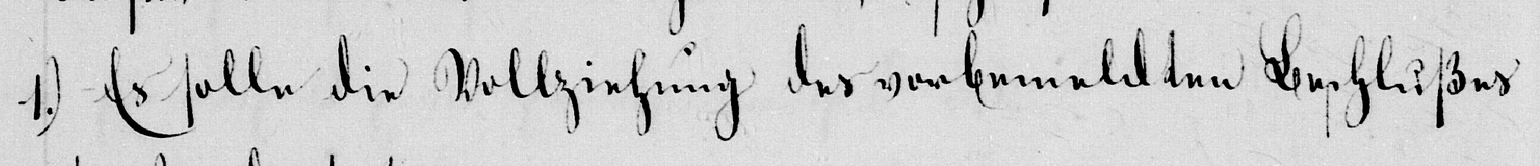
1.) Es solle die Vollziehung des vorbemeldeten Beschlußes
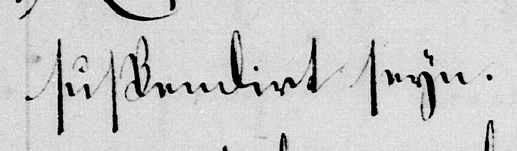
suspendirt seyn.
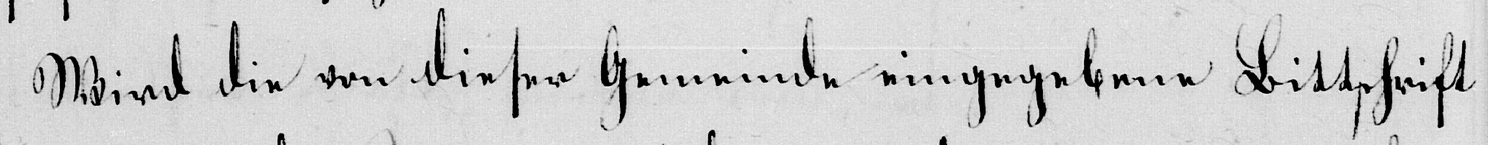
Wird die von dieser Gemeinde eingegebene Bittschrift
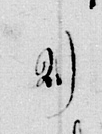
2.)
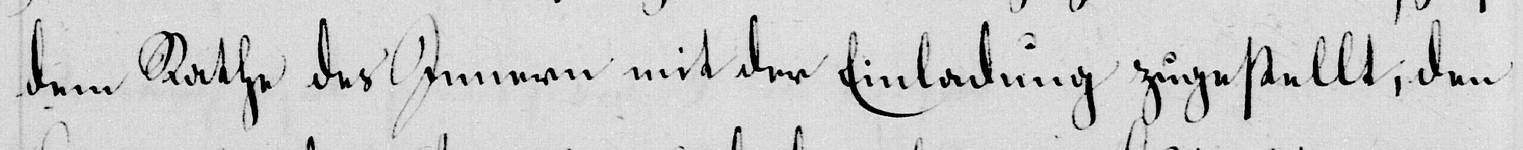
dem Rathe des Innern mit der Einladung zugestellt, den
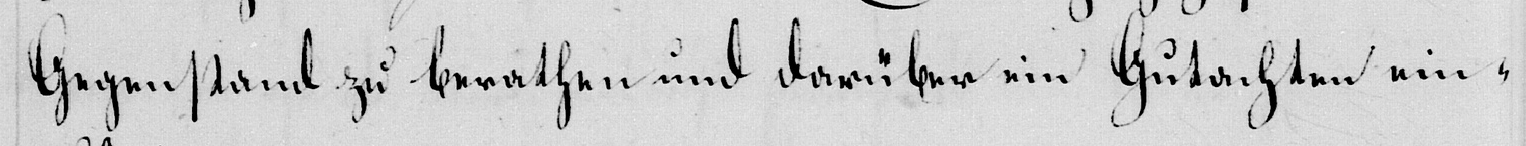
Gegenstand zu berathen und darüber ein Gutachten ein¬
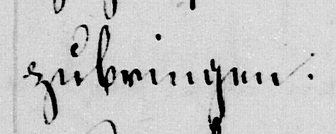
zubringen.
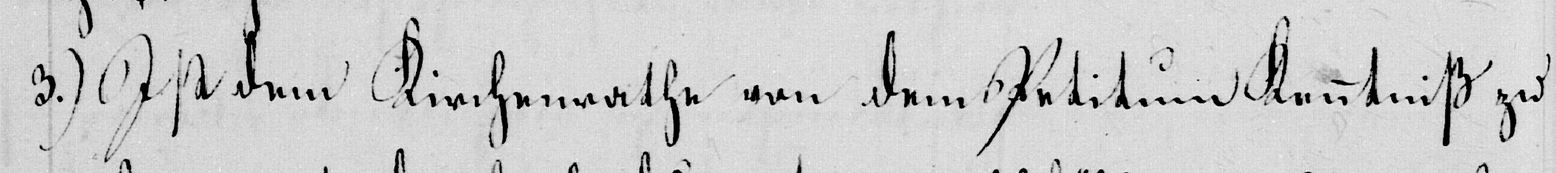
3.) Ist dem Kirchenrathe von dem Petitum Kenntniß zu
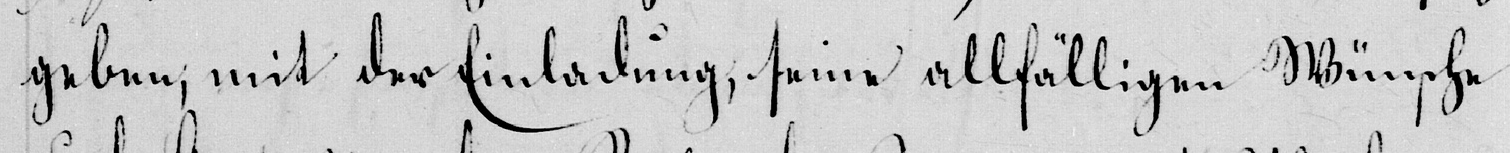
geben, mit der Einladung, seine allfälligen Wünsche
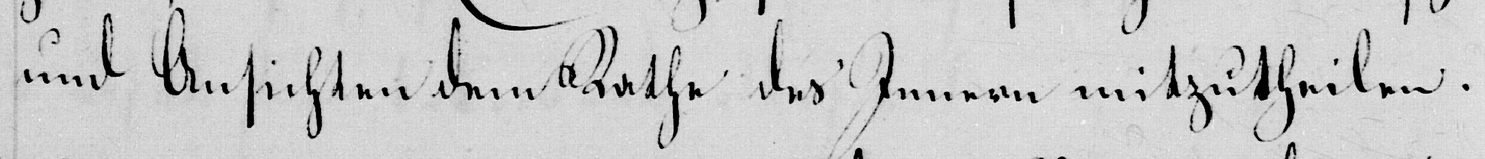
und Ansichten dem Rathe des Innern mitzutheilen.
